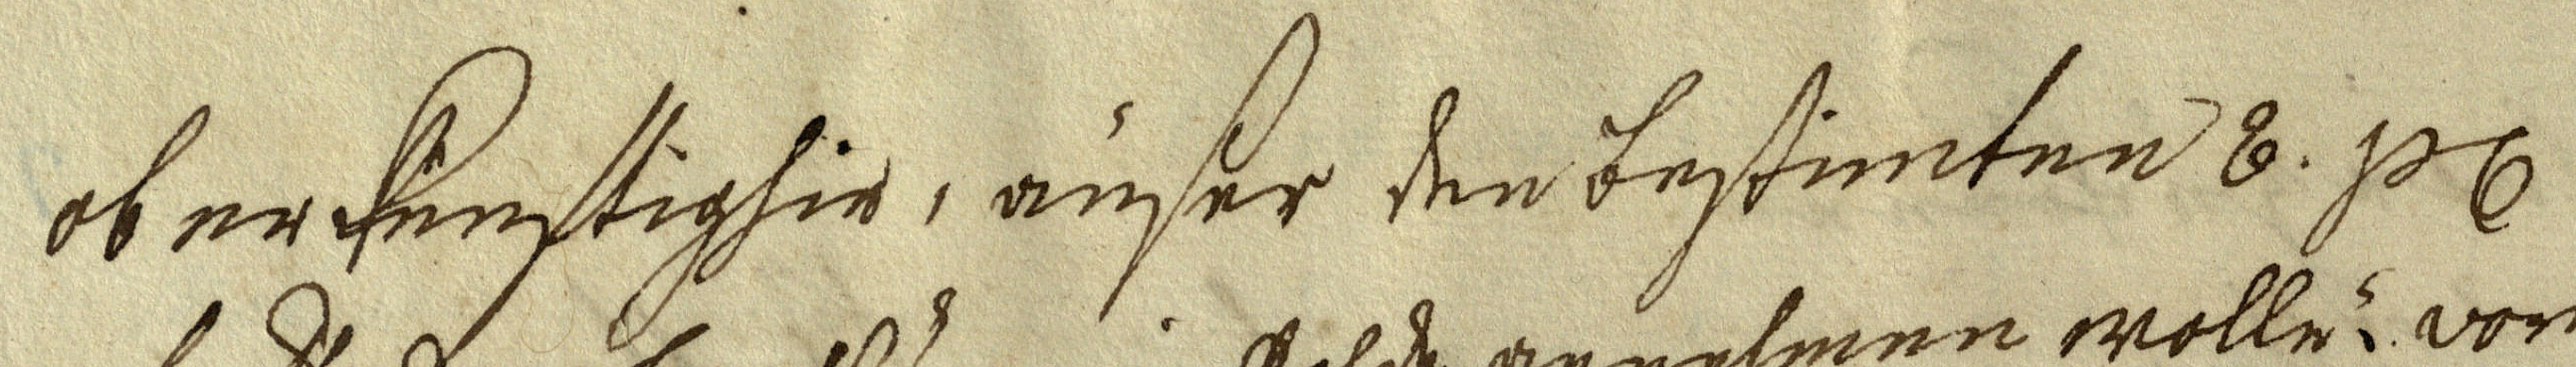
ob er künftighin außer den bestimten 8 p.
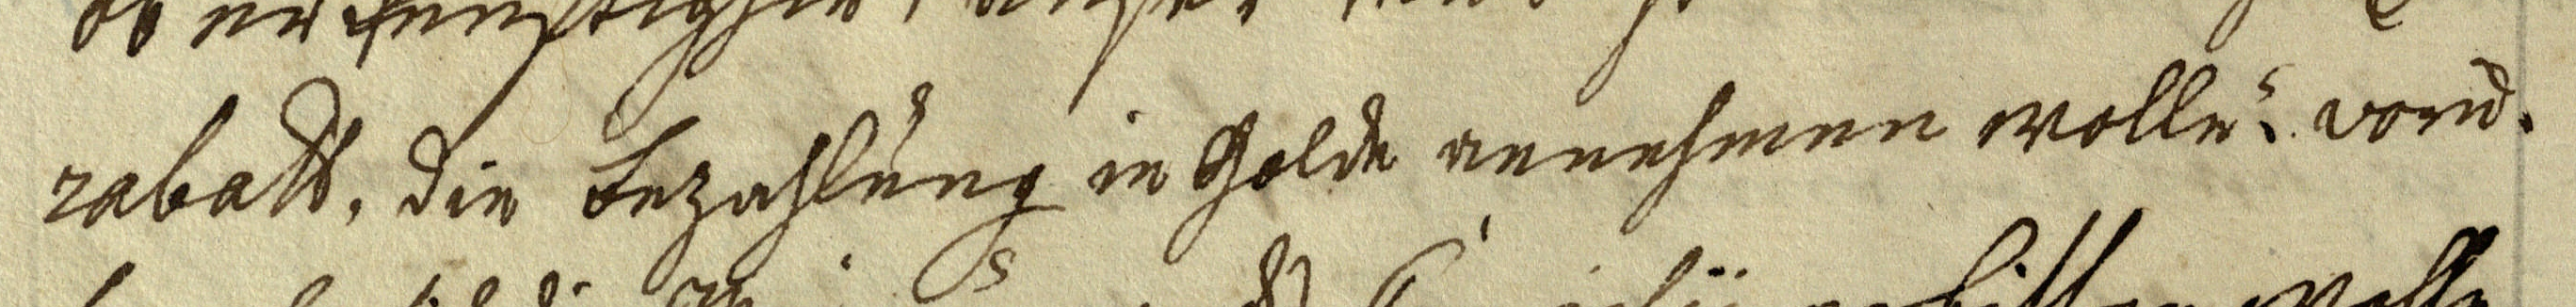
rabatt die Bezahlung in Golde annehmen wolle, worü¬
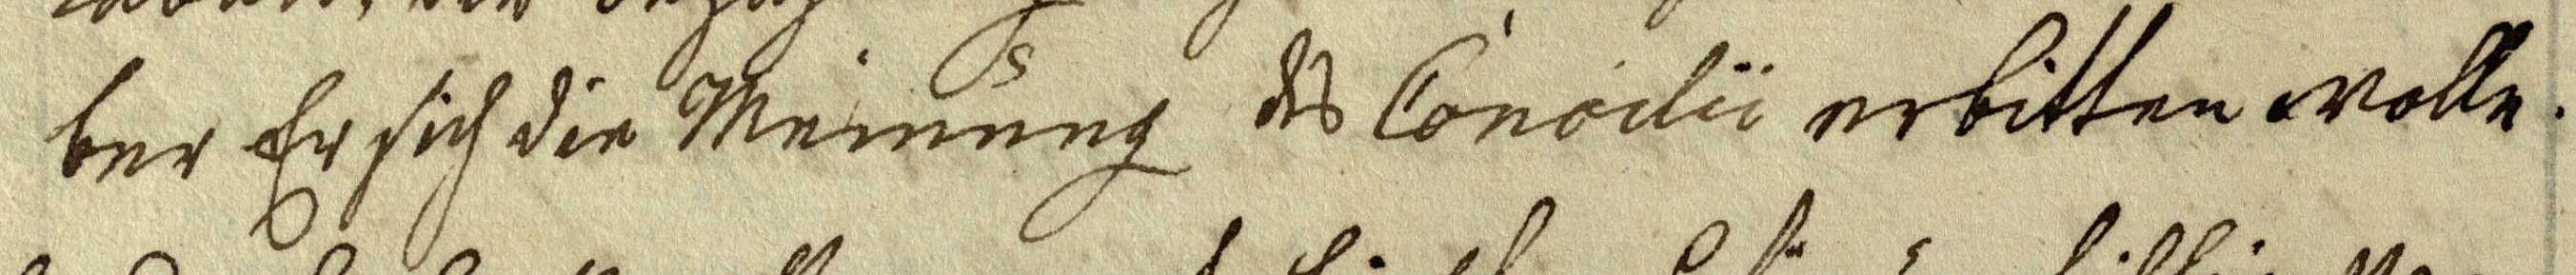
ber Er sich die Meinung des Concilii erbitten wolle.
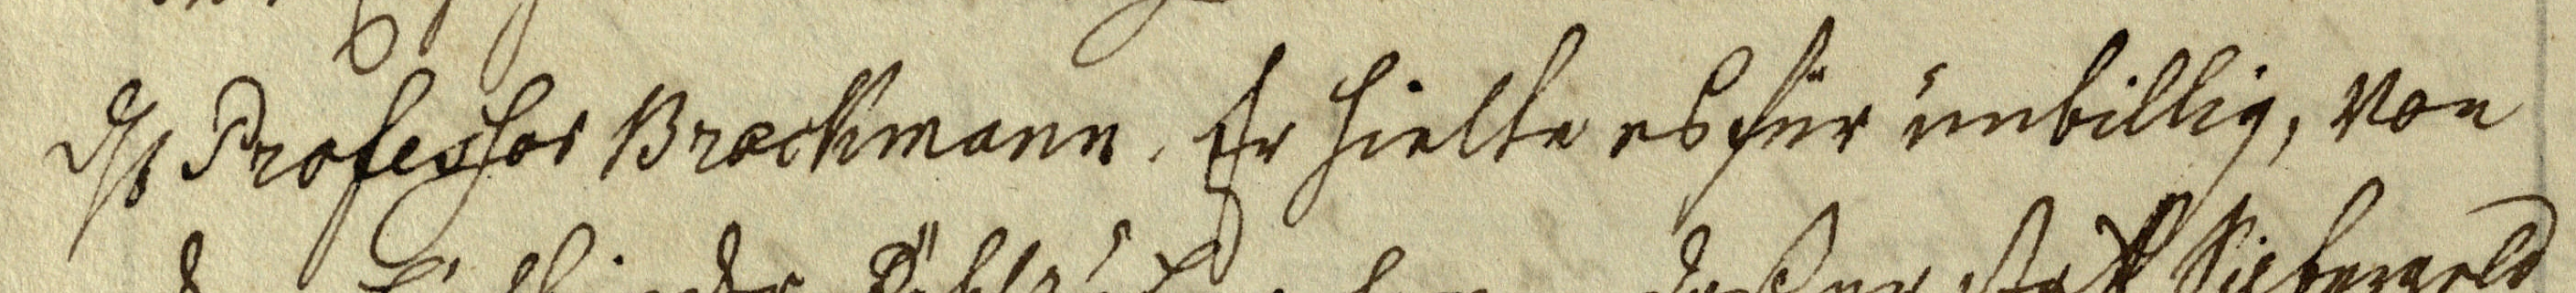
dh Professor Brockmann. Er hielte es für unbillig, von
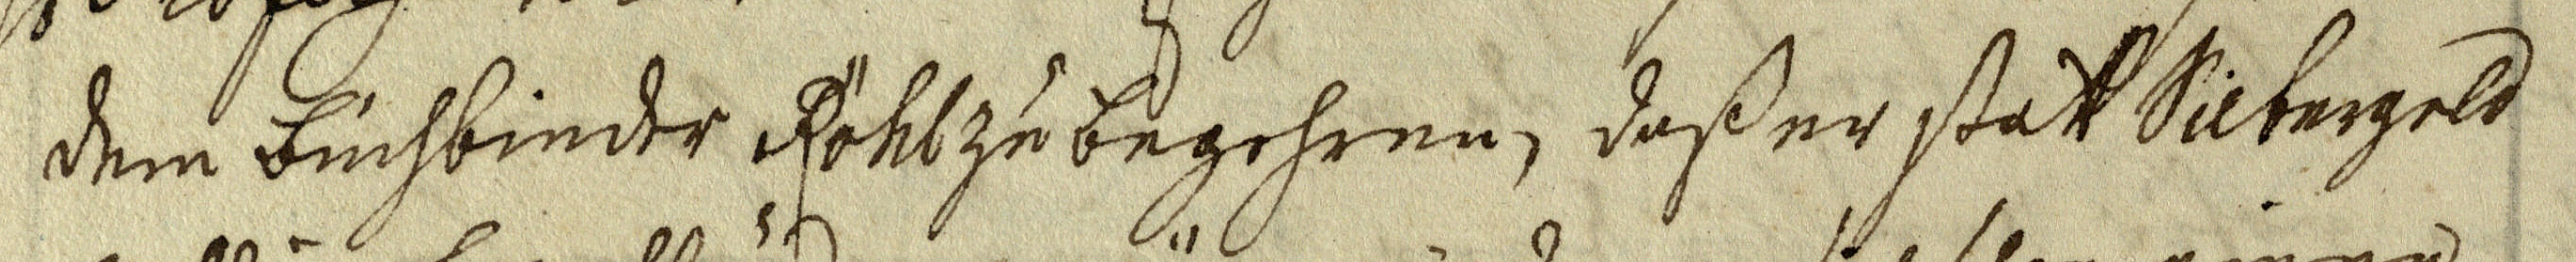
dem Buchbinder Röhl zu begehren, daß er statt Silbergeld
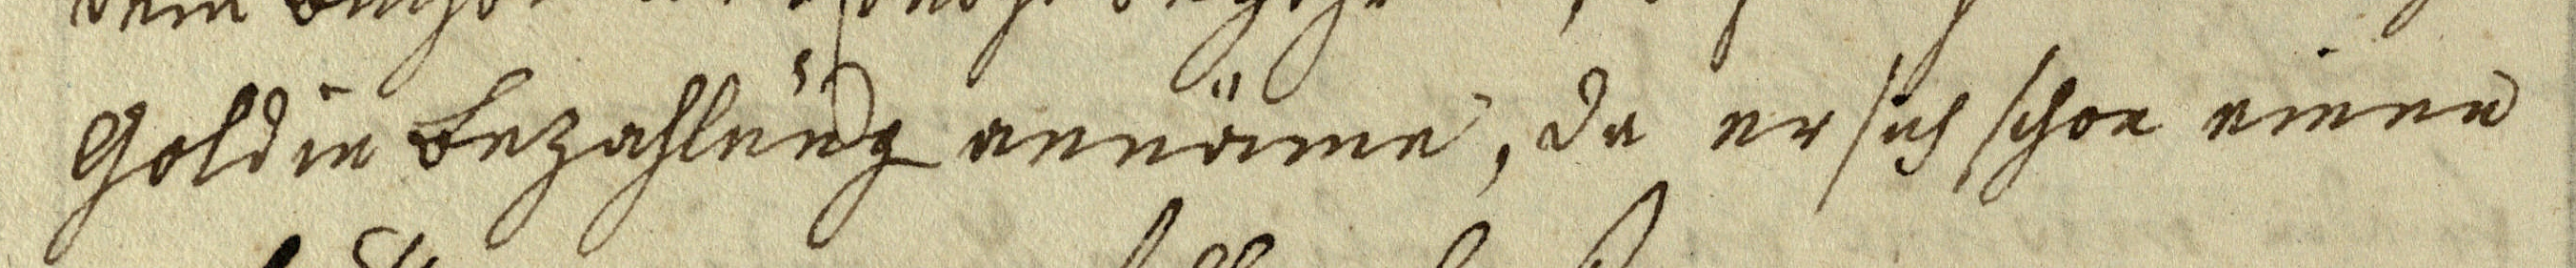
Gold in Bezahlung annäme, da er sich schon einen
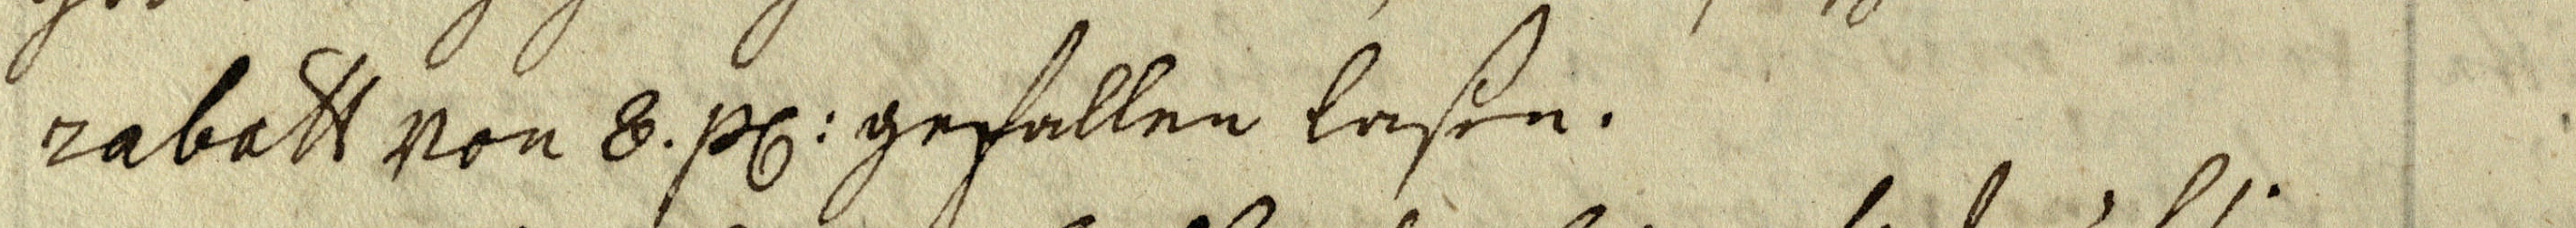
rabatt von 8 p: gefallen laßen.
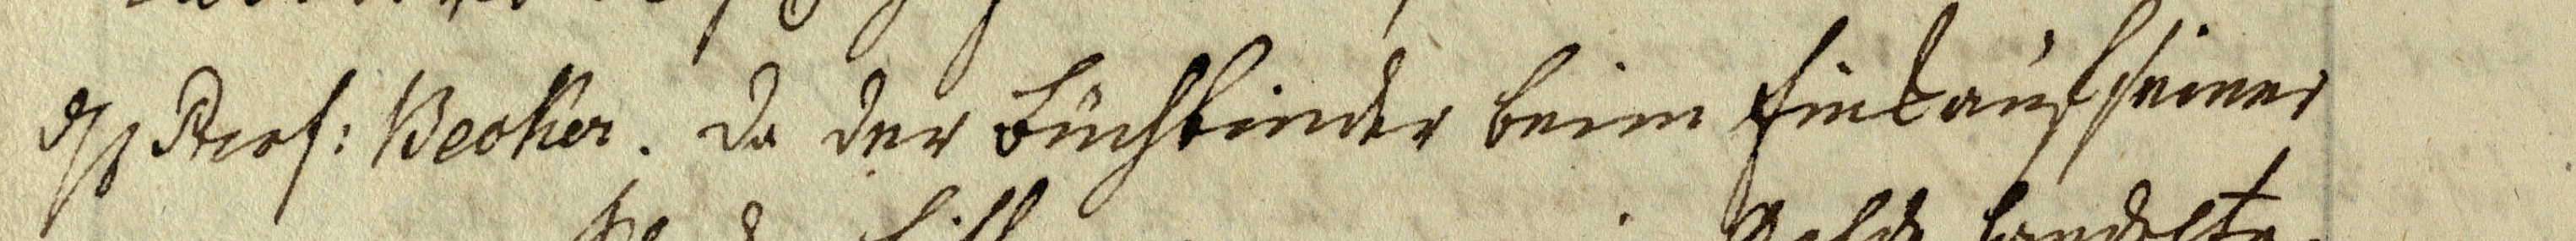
dh Prof: Becker. da der Buchbinder beim Einkauf seiner
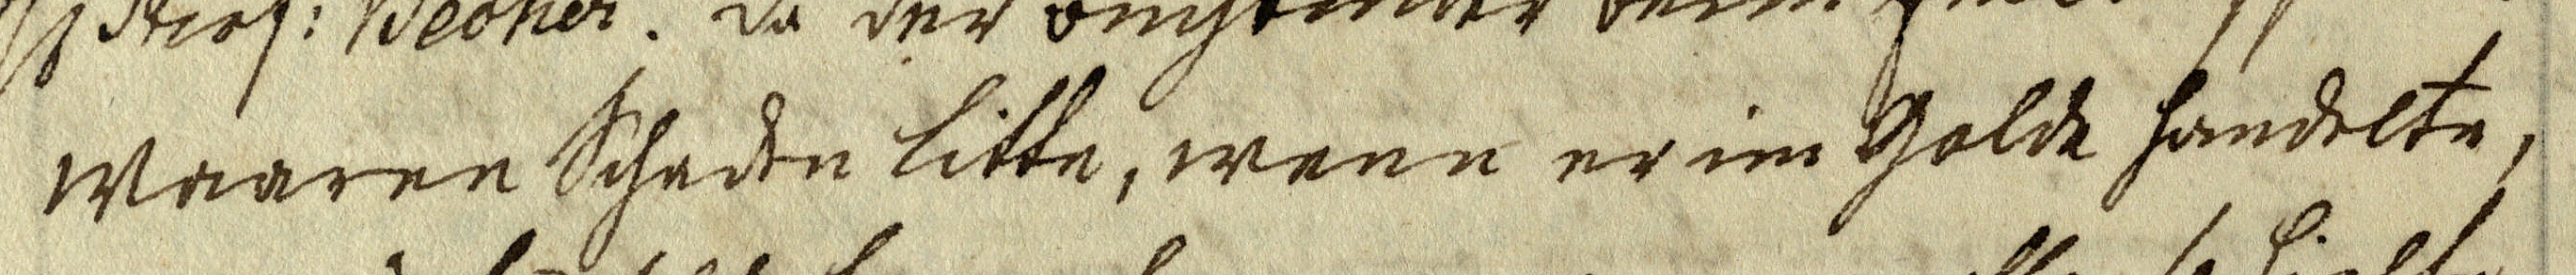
Waaren Schaden litte, wenn er im Golde handelte,
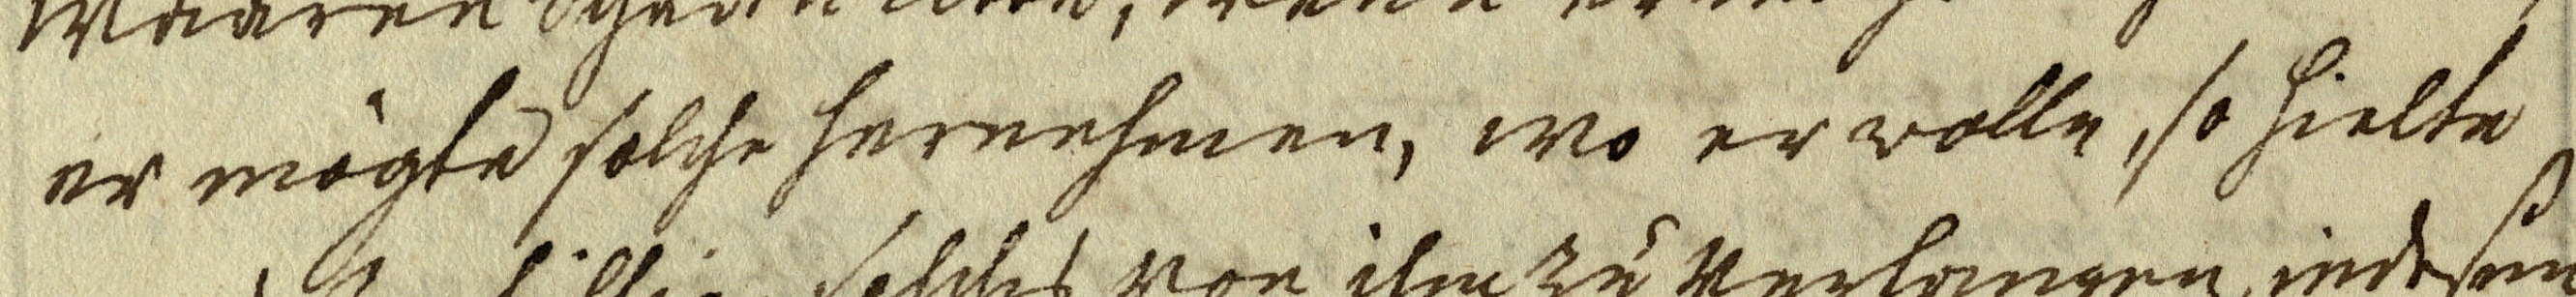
er mögte solche hernehmen, wo er wolle, so hielte
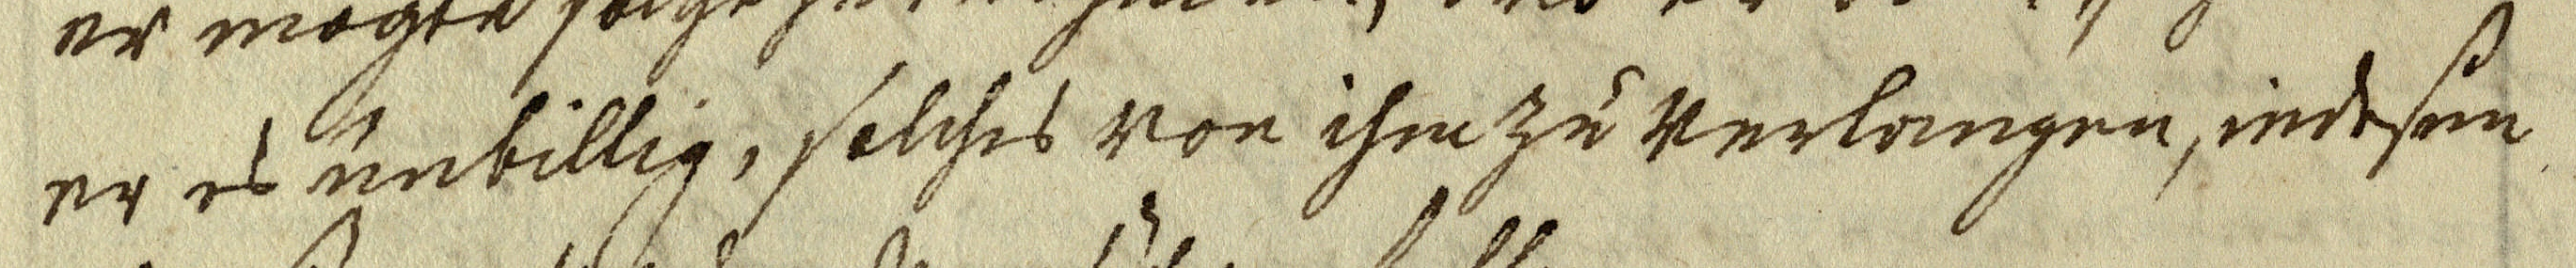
er es unbillig, solches von ihm zu verlangen, indeßen
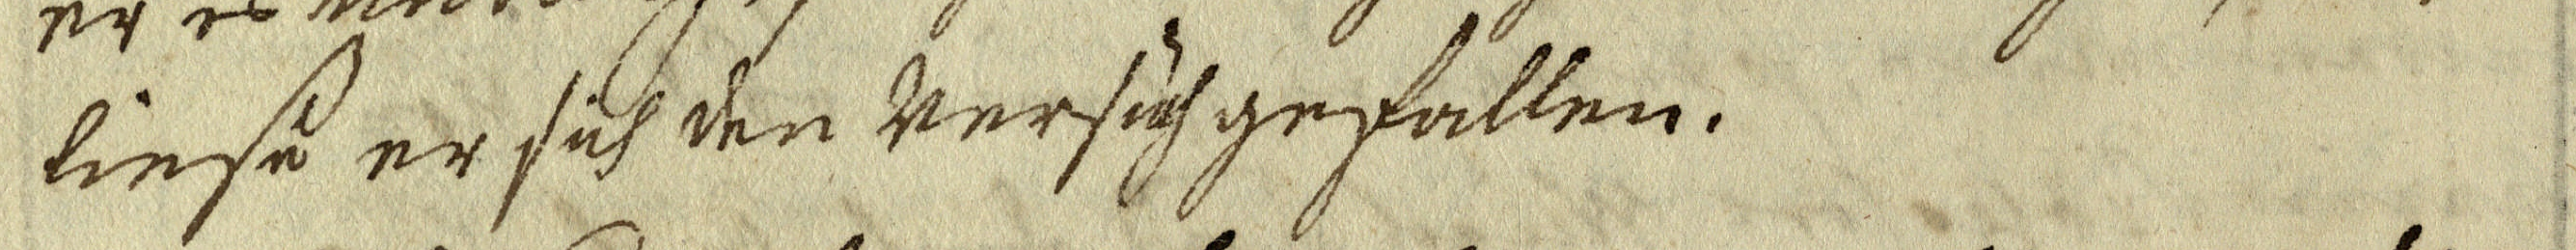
ließe er sich den Versuch gefallen.
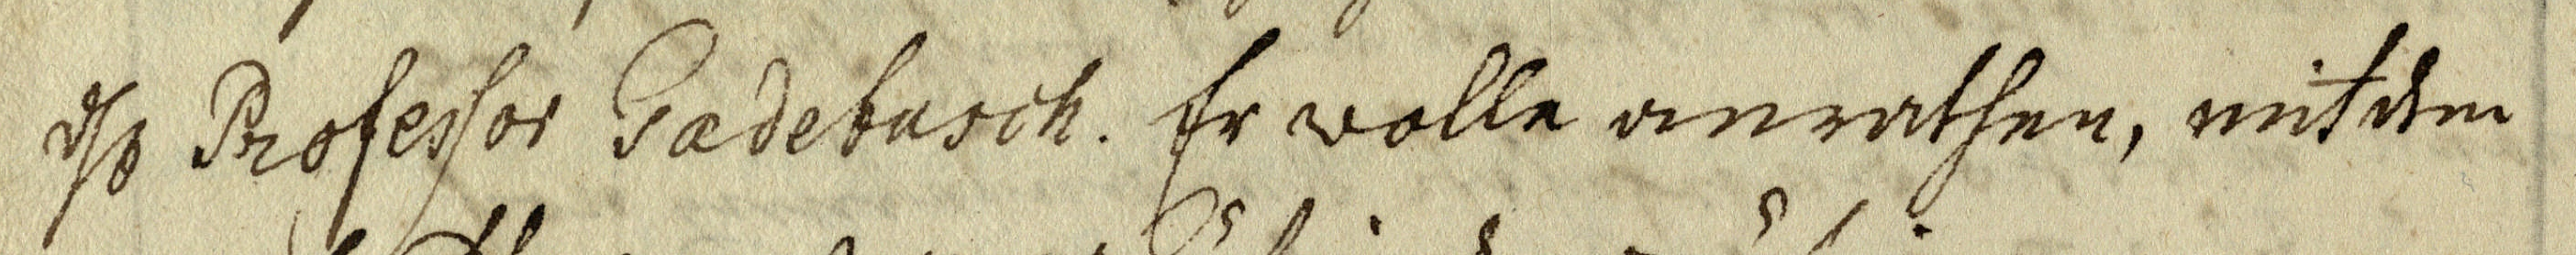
dh Professor Gadebusch. Er wolle anrathen, mit dem
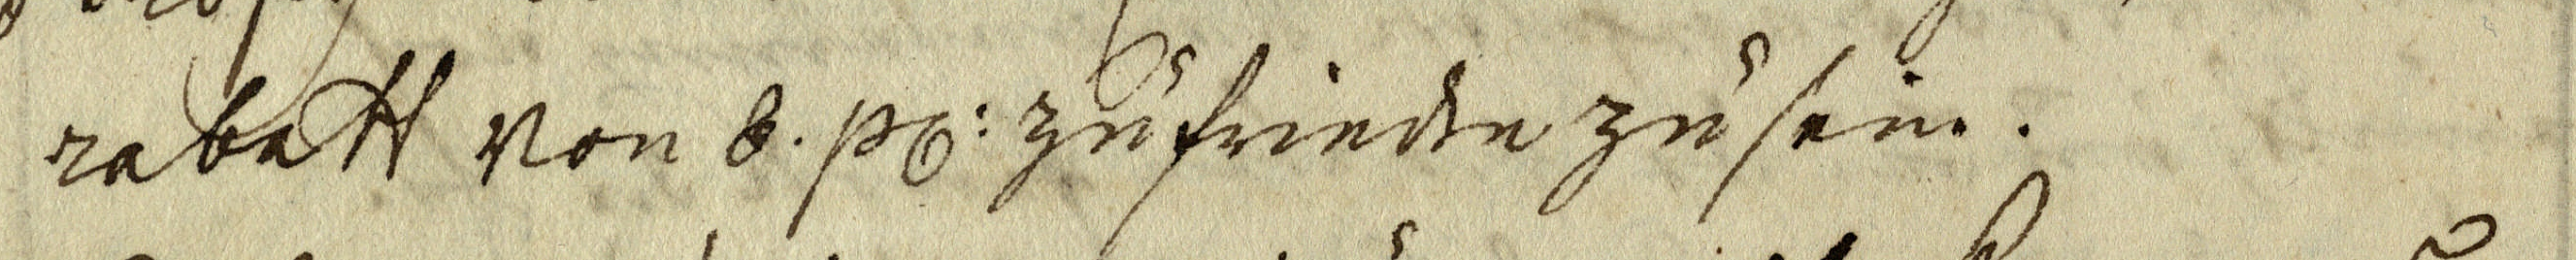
rabatt von 8 p: zufrieden zusein.
